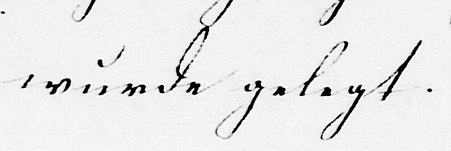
wurde gelegt.
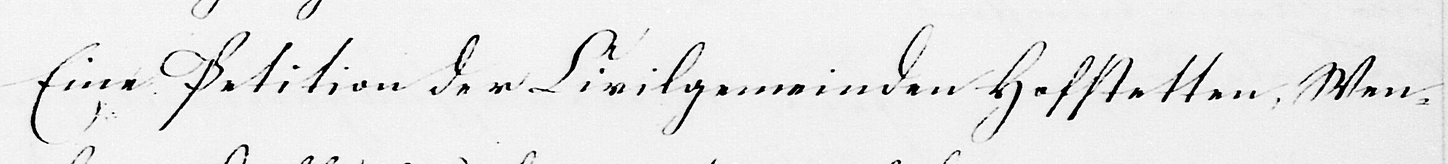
Eine Petition der Civilgemeinden Hofstetten, Wen¬
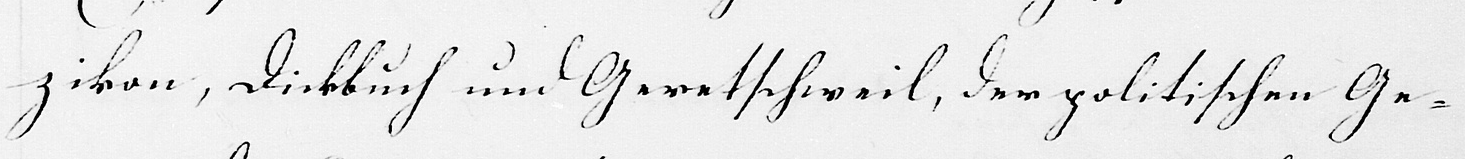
zikon, Dickbuch und Geretschweil, der politischen Ge¬
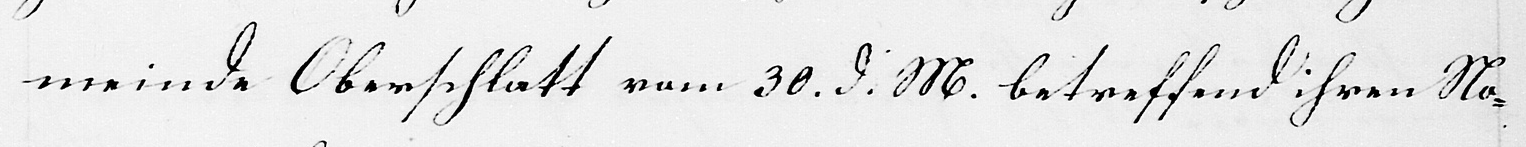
meinde Oberschlatt vom 30. d. M. betreffend ihren No¬
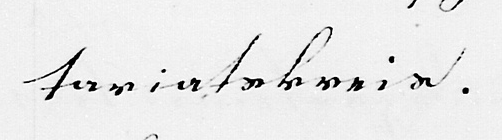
tariatskreis.
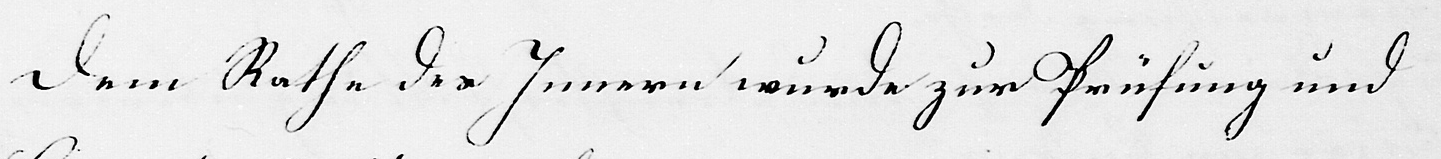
Dem Rathe des Innern wurde zur Prüfung und
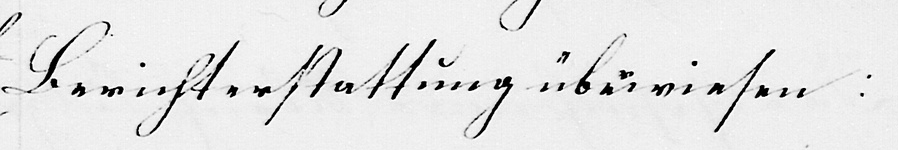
Berichterstattung überwiesen:
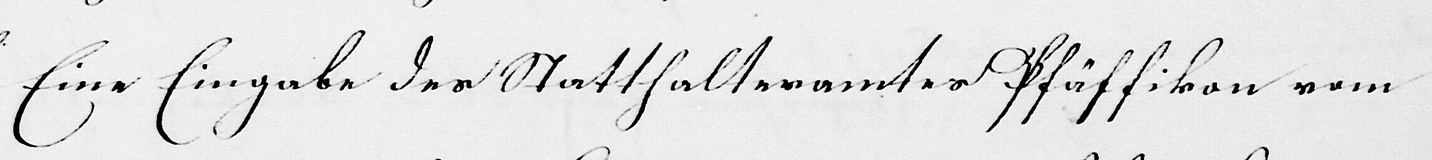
Eine Eingabe des Statthalteramtes Pfäffikon vom
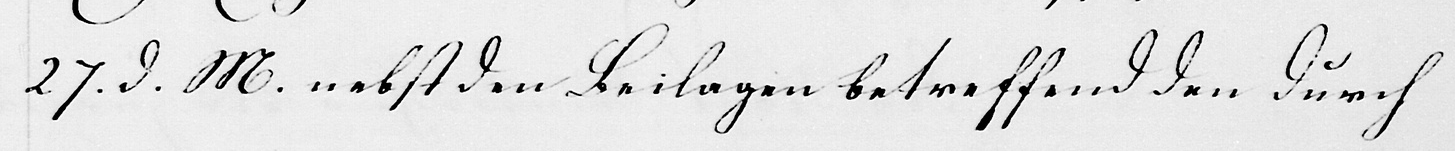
27. d. M. nebst den Beilagen betreffend den durch
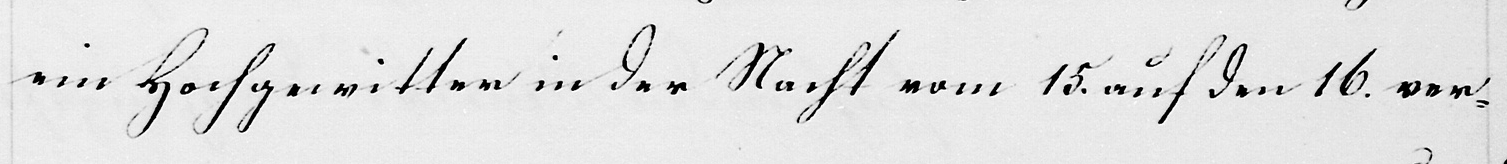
ein Hochgewitter in der Nacht vom 15. auf den 16. ver-
